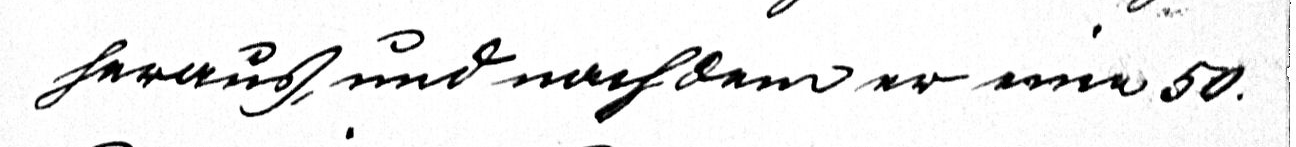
heraus, und nach dem er eine 50.
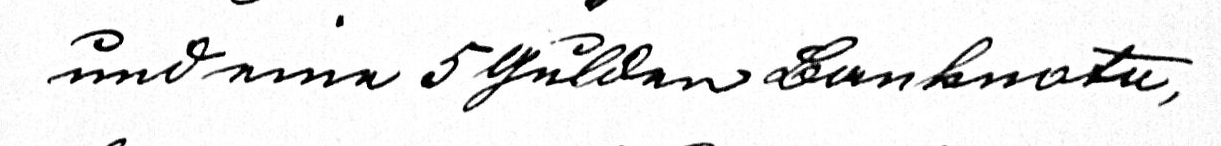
und eine 5 Gulden Banknote,
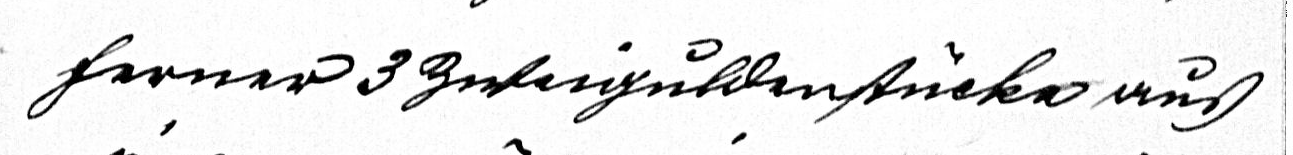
ferner 3 zweiguldenstücke aus
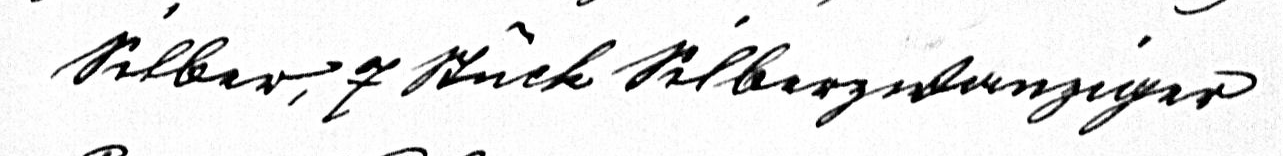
Silber, 7 Stück Silberzwanziger
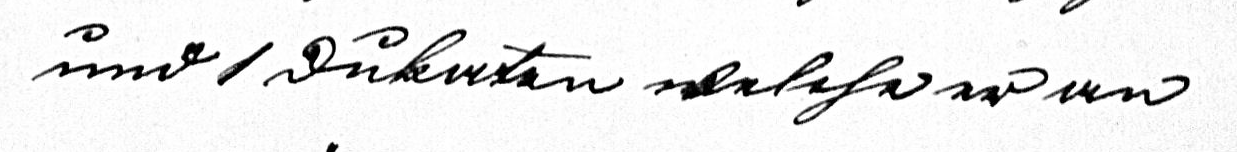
und 1 Dukaten welche er an
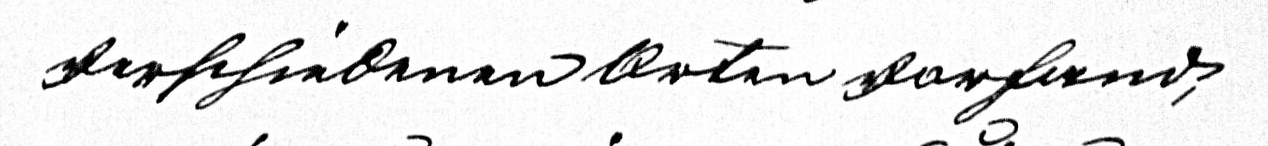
verschiedenen Orten vorfand,
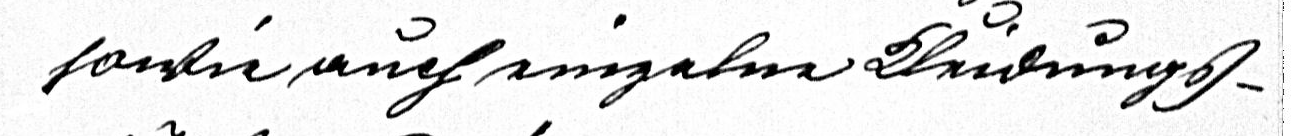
sowie auch einzelne Kleidungs¬
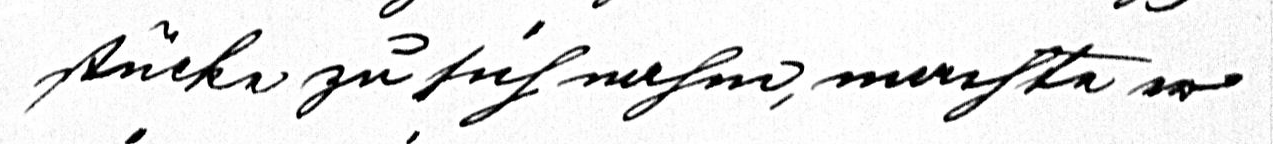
stücke zu sich nahm, machte er
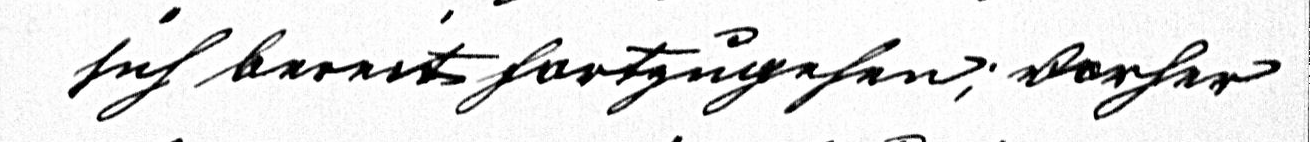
sich bereit fortzugehen; vorher
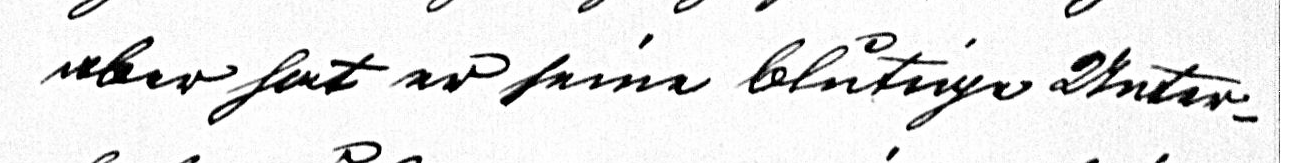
aber hat er seine blutige Unter¬
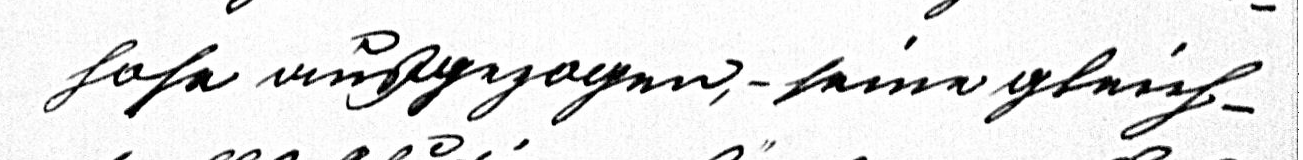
hofe ausgezogen, -seine gleich¬
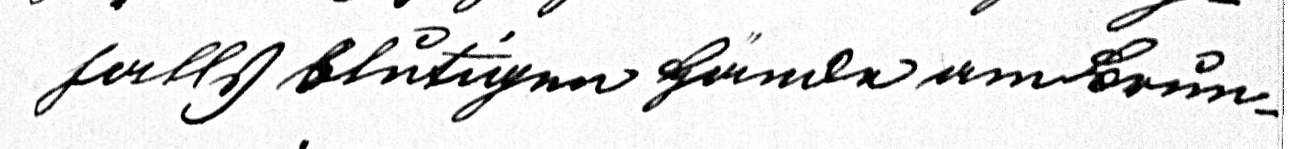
falls blutigen Hände am Brun¬
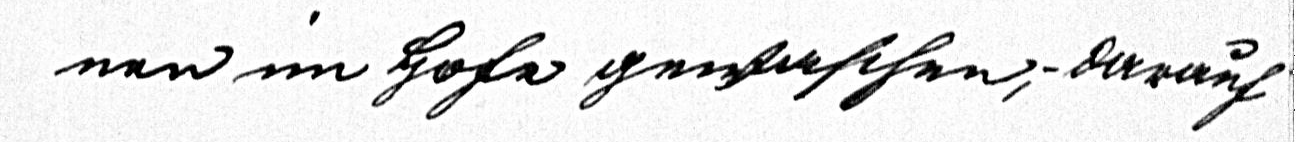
nen im Hofe gewaschen; darauf
